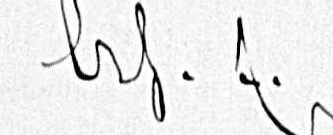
Ah E
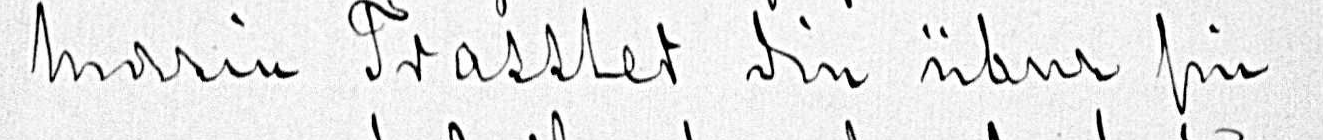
Marie Trattler die über sie
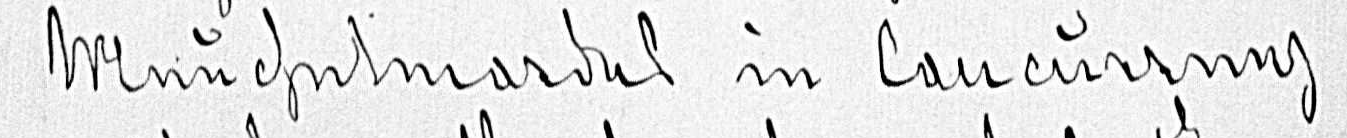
Meuchelmordes in Concurrenz
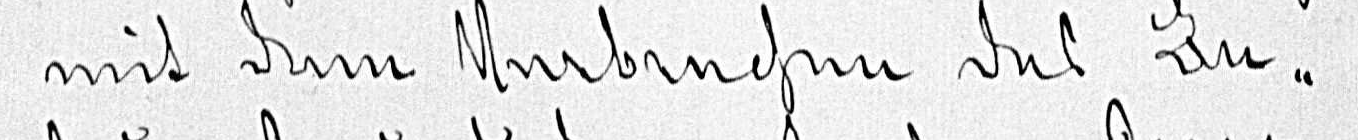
mit dem Verbrechen des Be¬
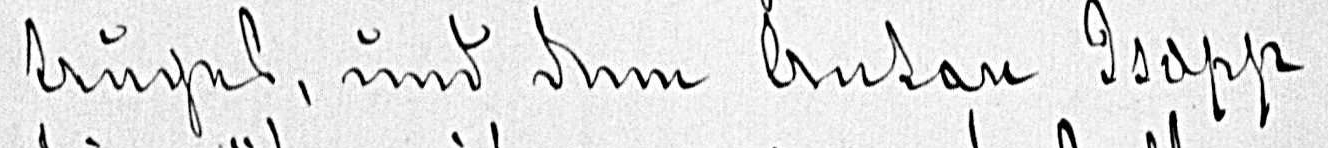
truges, und dem Anton Isopp
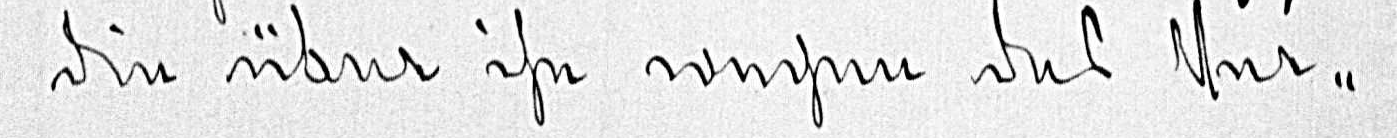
die über ihn wegen des Ver¬
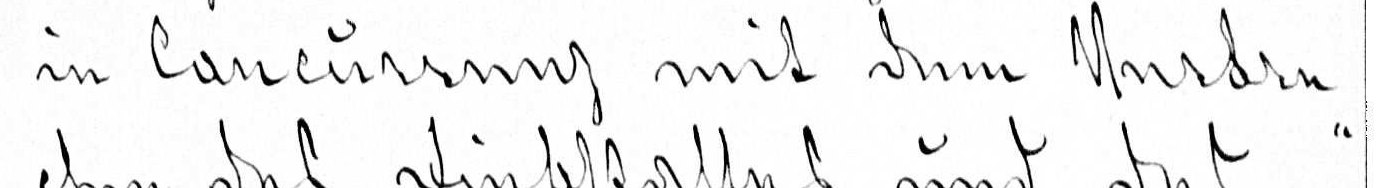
in Concurrenz mit dem Verbre¬
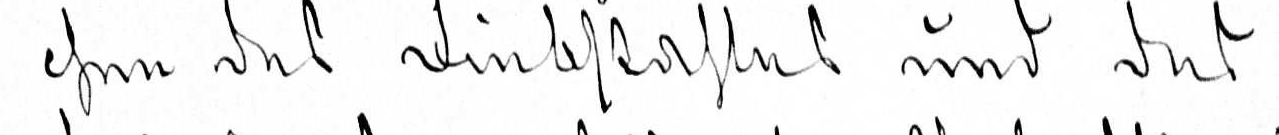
chen des Diebstahles und des
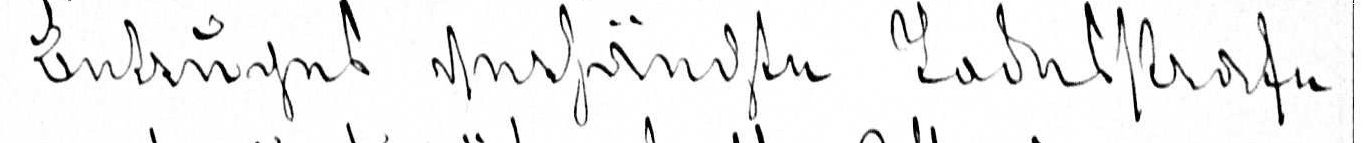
Betruges verhängte Todesstrafe
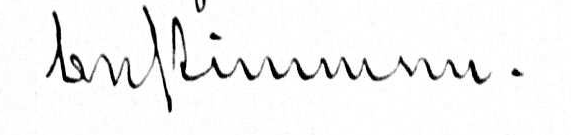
bestimmen.
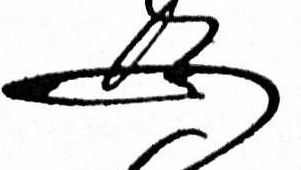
FJ
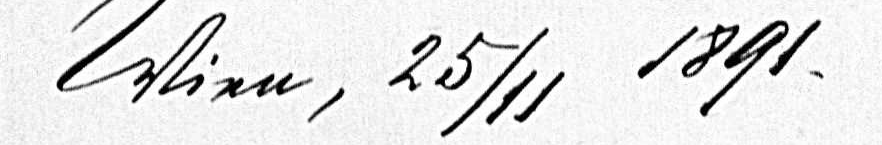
Wien, 25/11 1891
